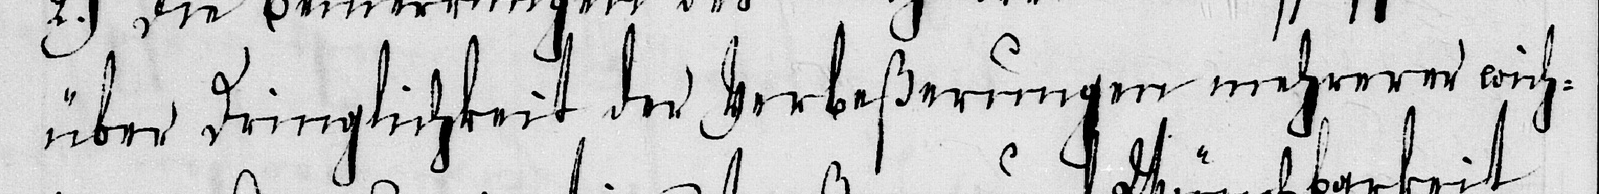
über Dringlichkeit der Verbeßerungen mehrerer wich¬
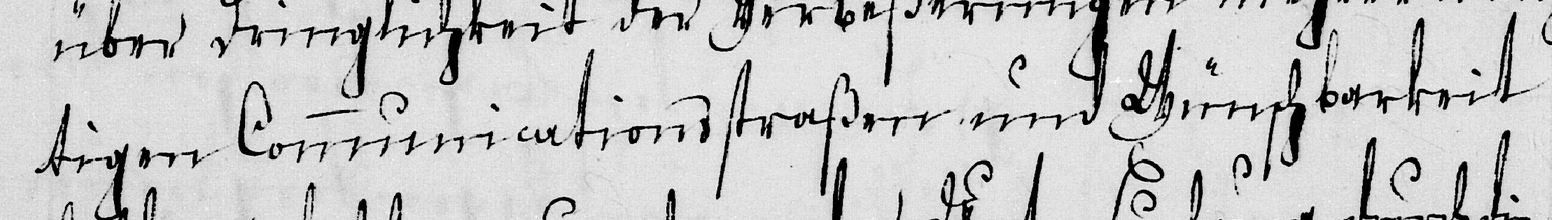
tigen Communicationsstraßen und Wünschbarkeit
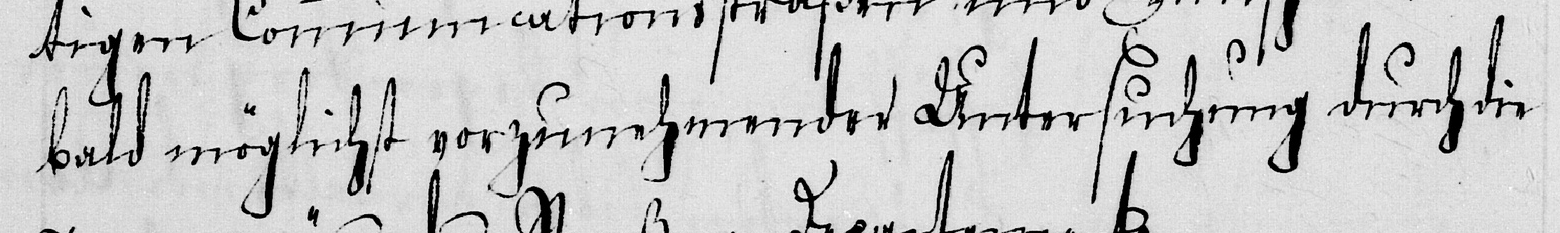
bald möglichst vorzunehmender Untersuchung durch die
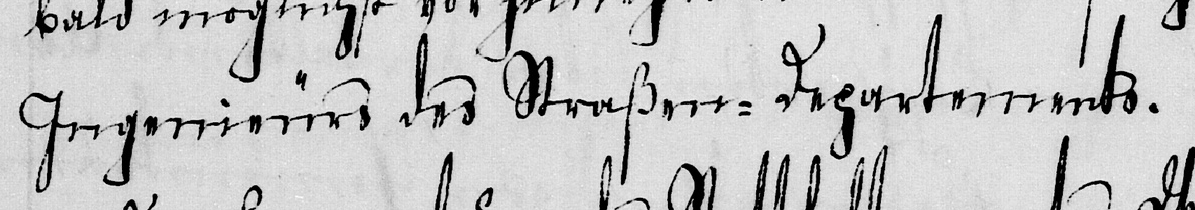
Ingenierus des Straßen-Departements.
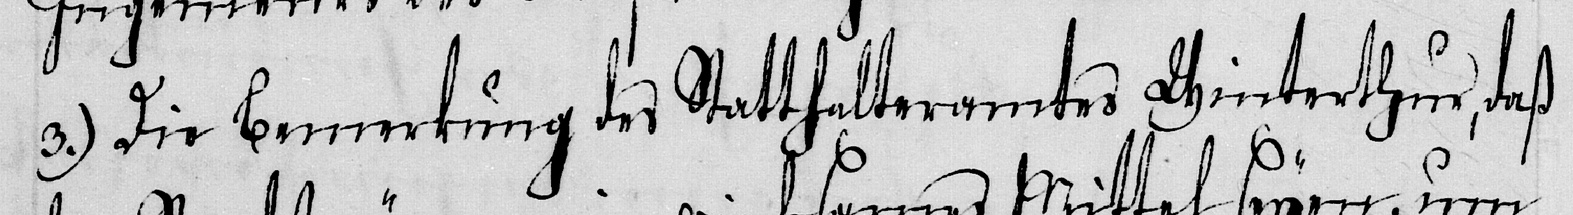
3.) Die Bemerkung des Statthalteramtes Winterthur, daß
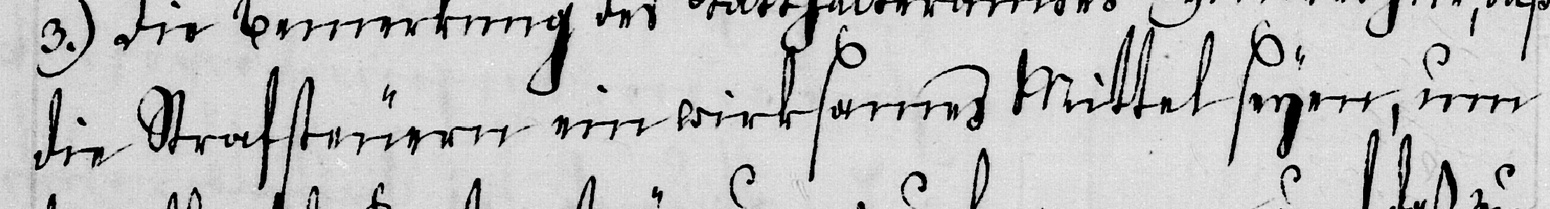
die Strafsteuern ein wirksames Mittel seyen, um
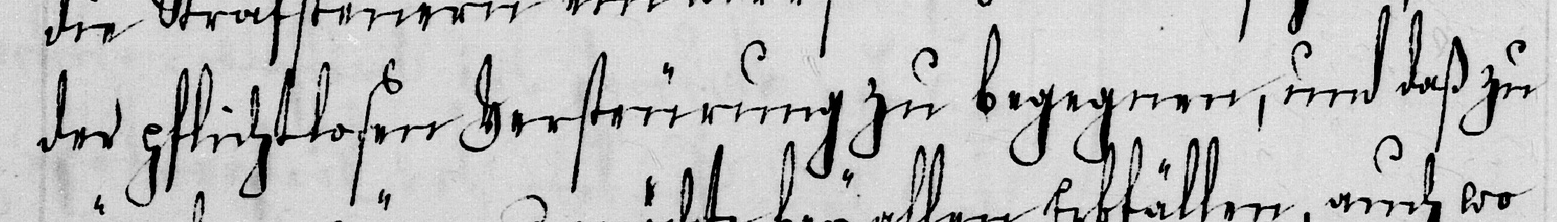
der pflichtlosen Versteuerung zu begegnen, und daß zu
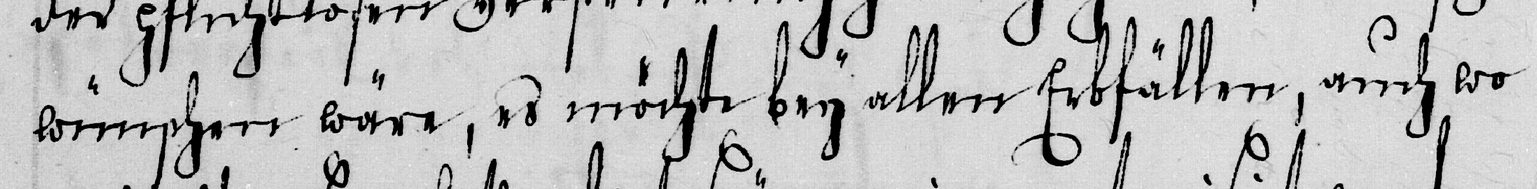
wünschen wäre, es möchte bey allen Erbfällen, auch wo
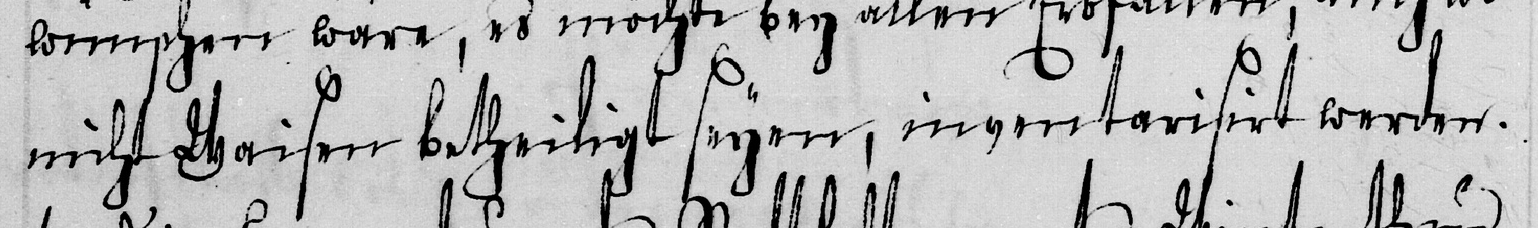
nicht Waisen betheiligt seyen, inventarisirt werden.
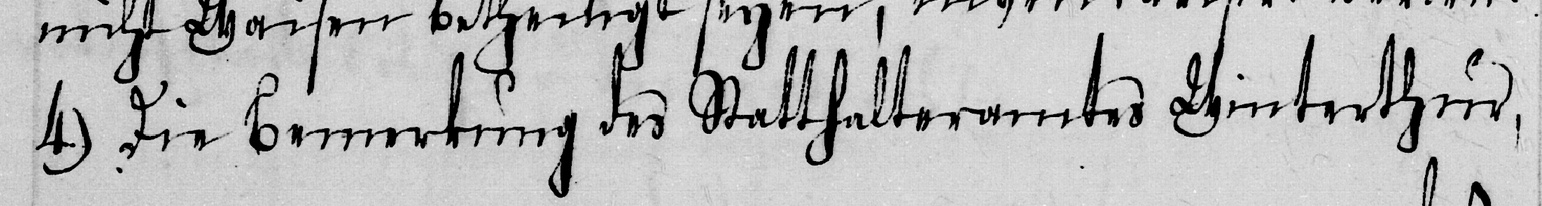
4.) Die Bemerkung des Statthalteramtes Winterthur,
